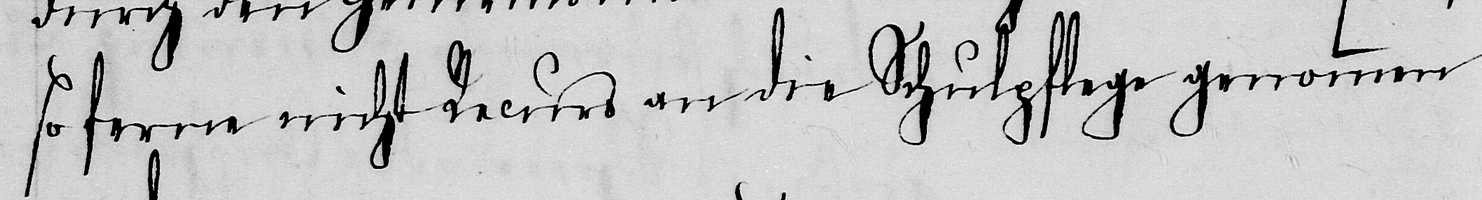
so ferne nicht Recurs an die Schulpflege genommen
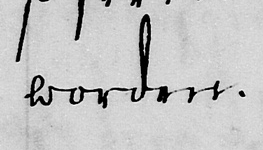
worden.
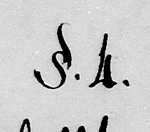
§. 4.
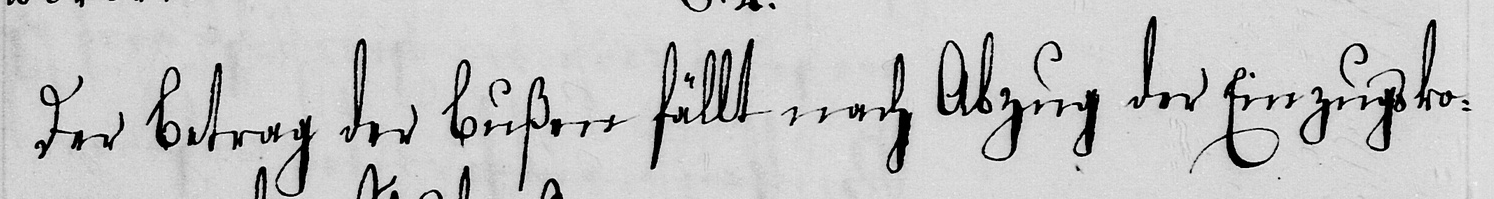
Der Betrag der Bußen fällt nach Abzug der Einzugsko¬
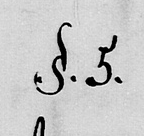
§. 5.
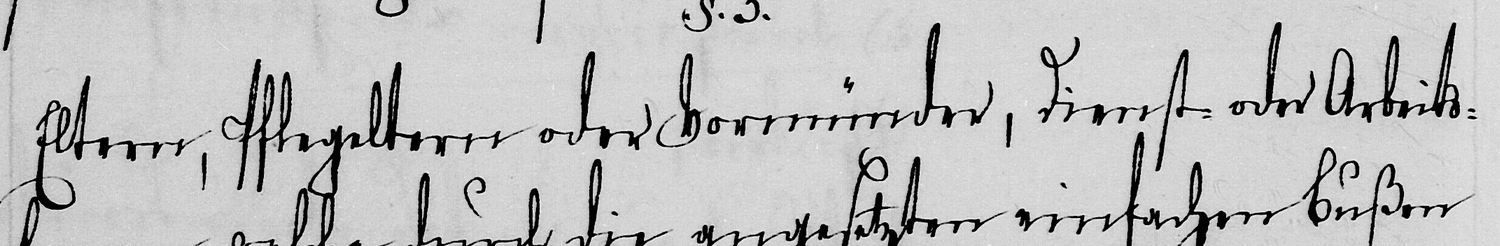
Eltern, Pflegeltern oder Vormünder, Dienst- oder Arbeit¬
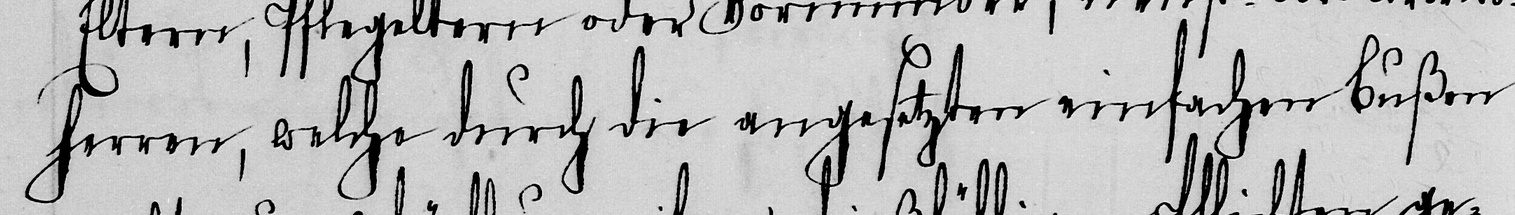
sherren, welche durch die angesetzten einfachen Bußen
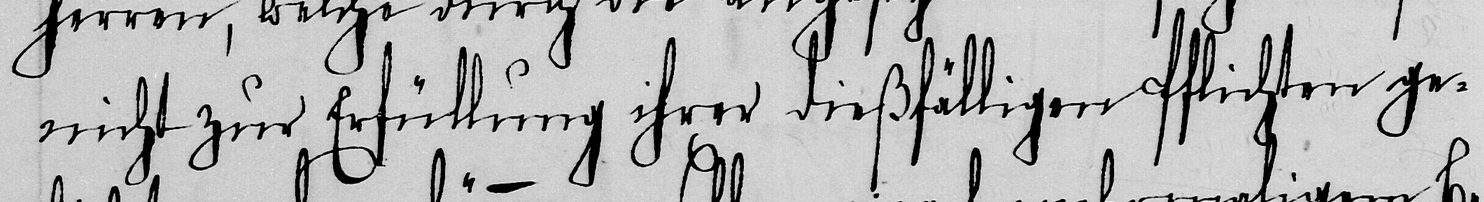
nicht zur Erfüllung ihrer dießfälligen Pflichten ge¬
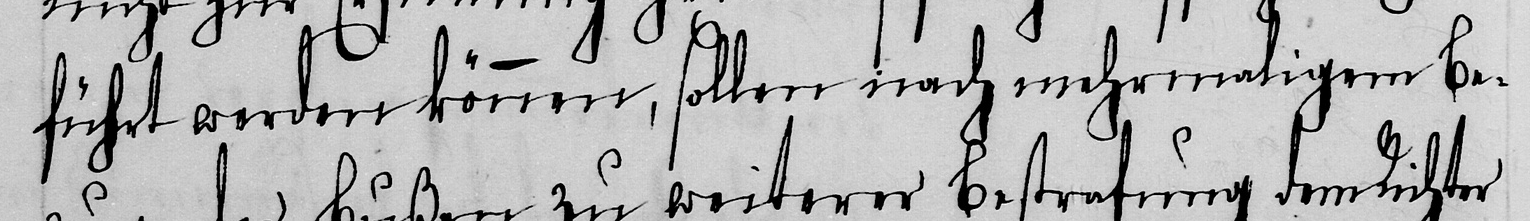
führt werden können, sollen nach mehrmaligem Be¬
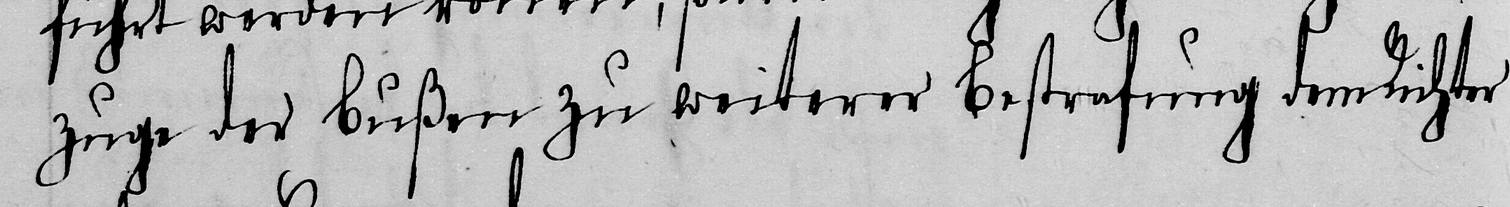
zuge der Bußen zu weiterer Bestrafung dem Richter
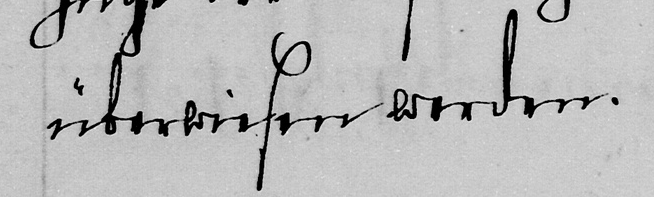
überwiesen werden.
